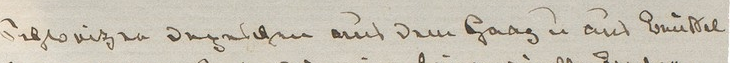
Schweizer Depeschen aus dem Haag u aus Brüssel
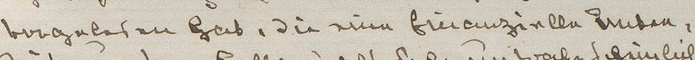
vorgelesen hat, die eine finanzielle Unter-
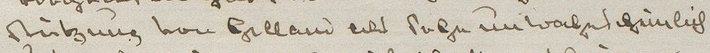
stützung von Holland als sehr unwahrscheinlich
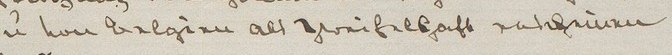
u von Belgien als zweifelhaft erscheinen
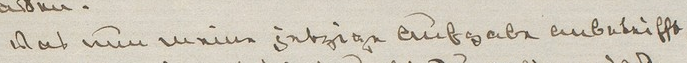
Was nun meine jetzige Aufgabe anbetrifft,
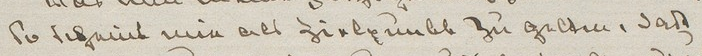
so scheint mir als Zielpunkt zu gelten, daß
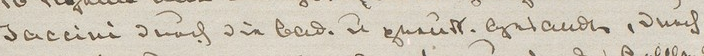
Jaccini durch die bad. und preuss. Gesandten, durch
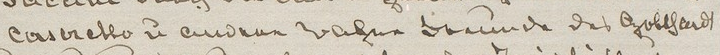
Casoretto u andere wahre Freunde des Gotthards
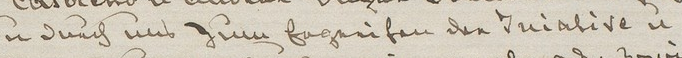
u durch uns zum Ergreifen der Initiative u
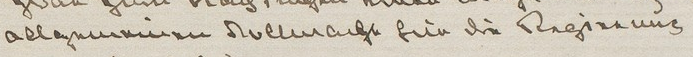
allgemeinen Vollmacht für die Regierung
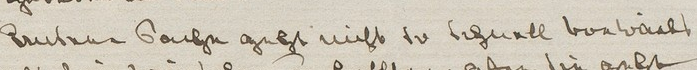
Unsere Sache geht nicht so schnell vorwärts
